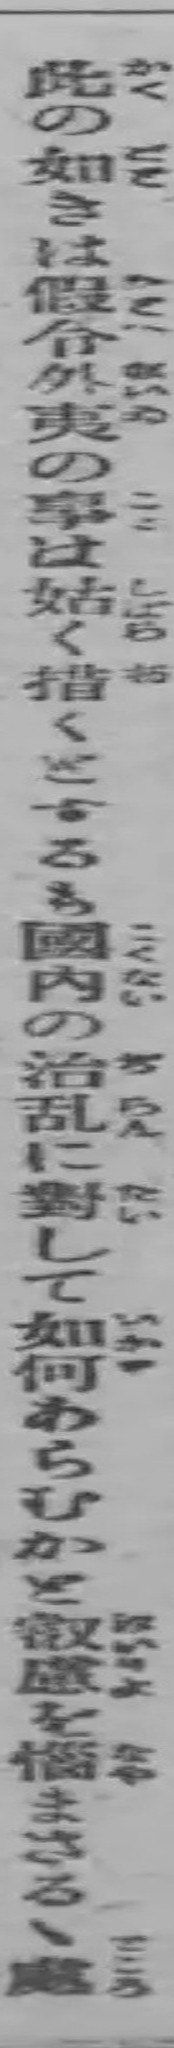此の如きは仮令外夷の事は姑く措くとするも国内の治乱に対して如何あらむかと叡慮を悩まさるゝ処
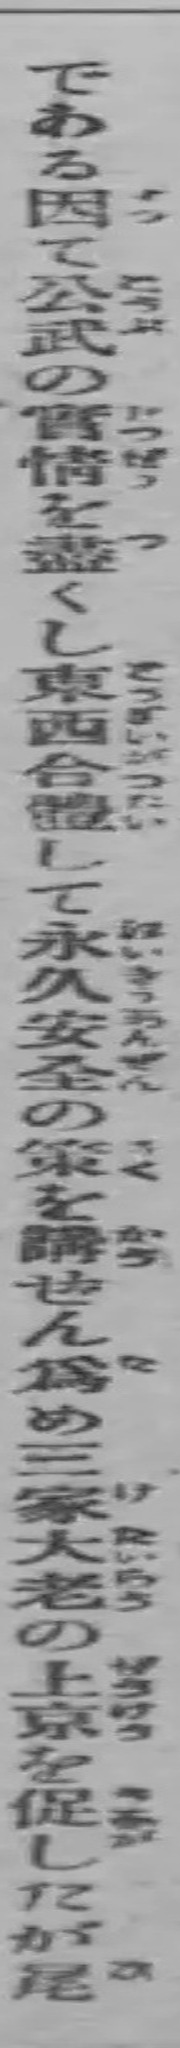である因て公武の実情を尽くし東西合体して永久安全の策を講ぜん為め三家大老の上京を促したが尾
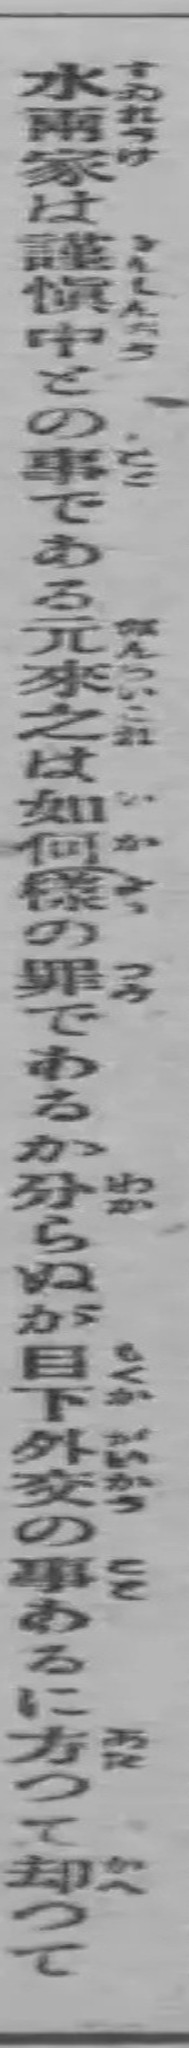水両家は謹慎中との事である元来之は如何様の罪であるか分らぬが目下外交の事あるに方つて却つて
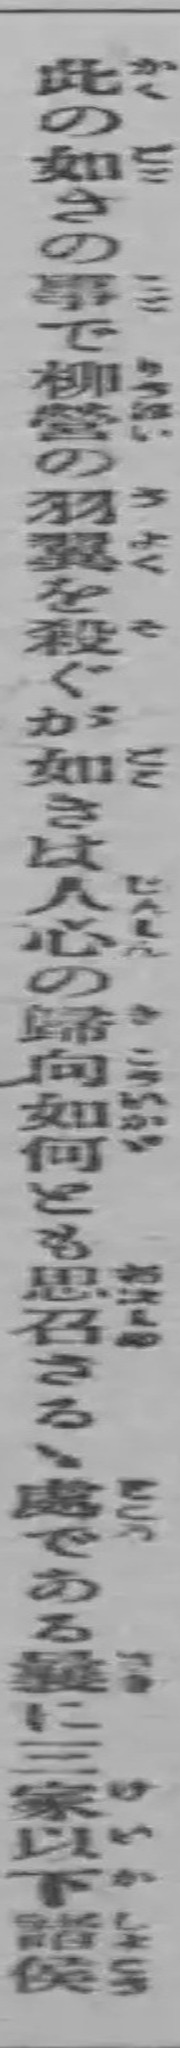此の如きの事で柳営の羽翼を殺ぐが如きは人心の帰向如何とも思召さるゝ処である曩に三家以下諸侯
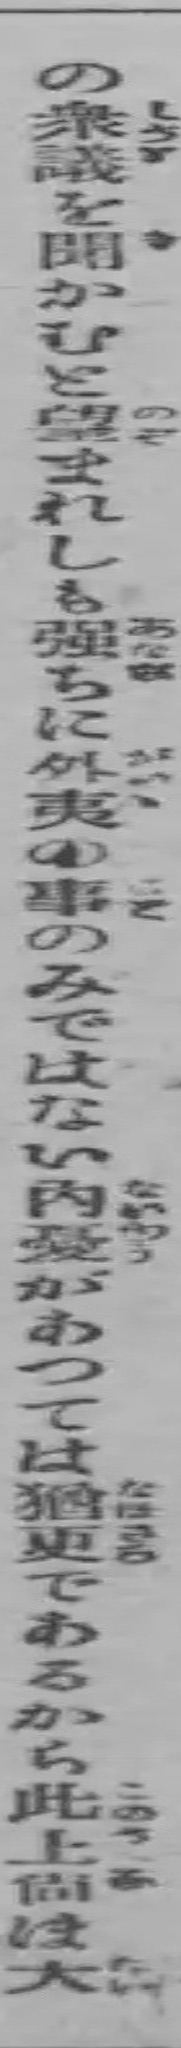の衆議を聞かむと望まれしも強ちに外夷の事のみではない内憂があつては猶更であるから此上尚ほ大
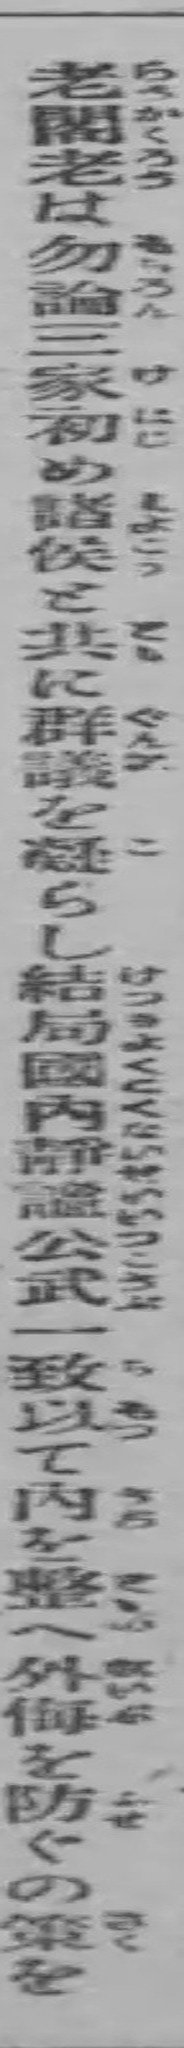老閣老は勿論三家初め諸侯と共に群議を凝らし結局国内静謐公武一致以て内を整へ外侮を防ぐの策を
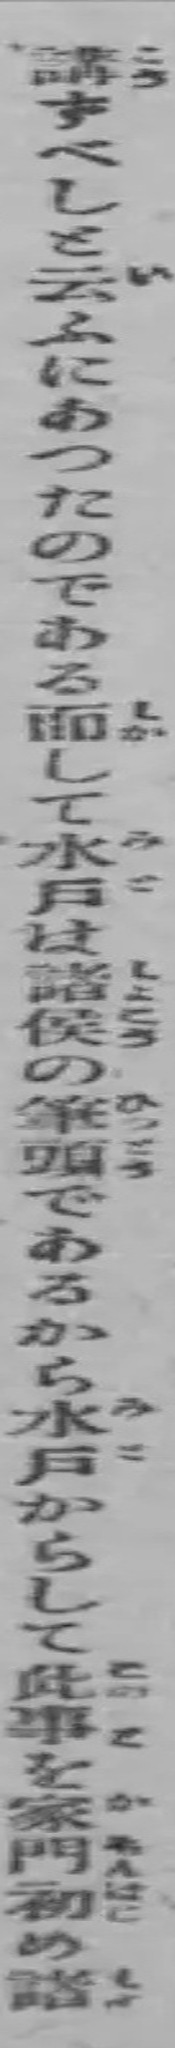講ずべしと云ふにあつたのである而して水戸は諸侯の筆頭であるから水戸からして此事を家門初め諸
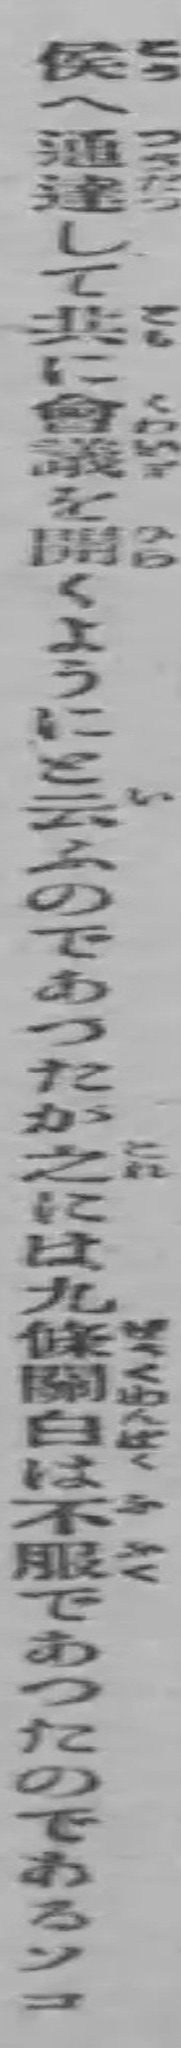侯へ通達して共に会議を開くようにと云ふのであつたが之には九条関白は不服であつたのであるソコ
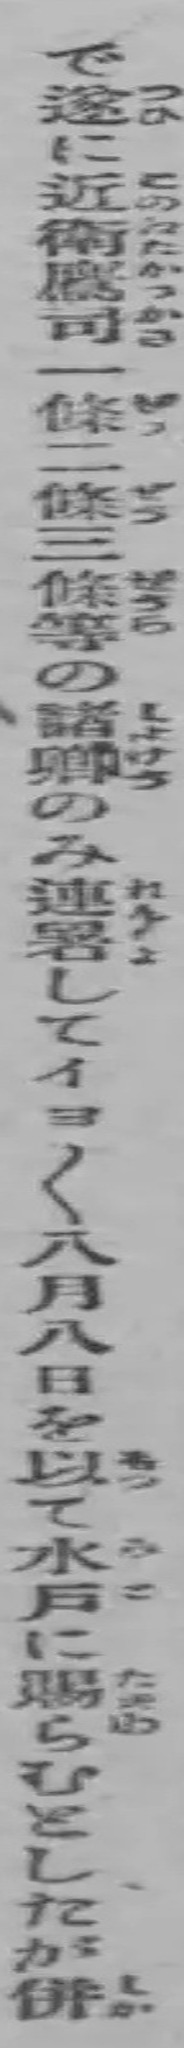で遂に近衛鷹司一条二条三条等の諸卿のみ連署してイヨ〳〵八月八日を以て水戸に賜らむとしたが併
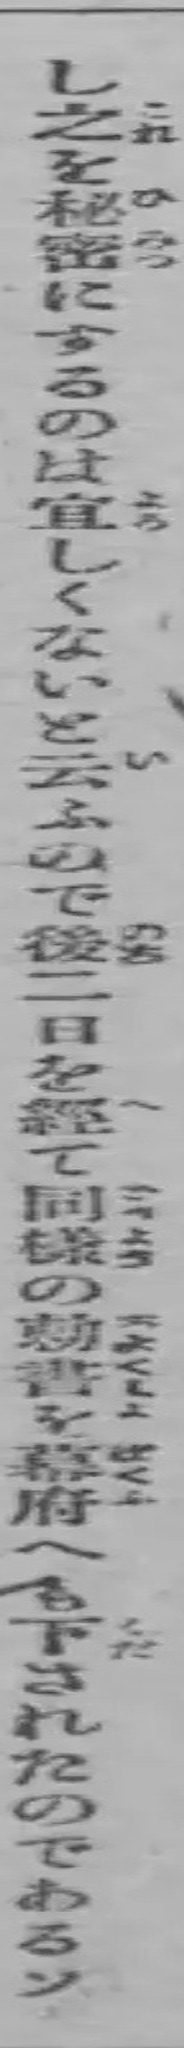し之を秘密にするのは宜しくないと云ふので後二日を経て同様の勅書を幕府へも下されたのであるソ
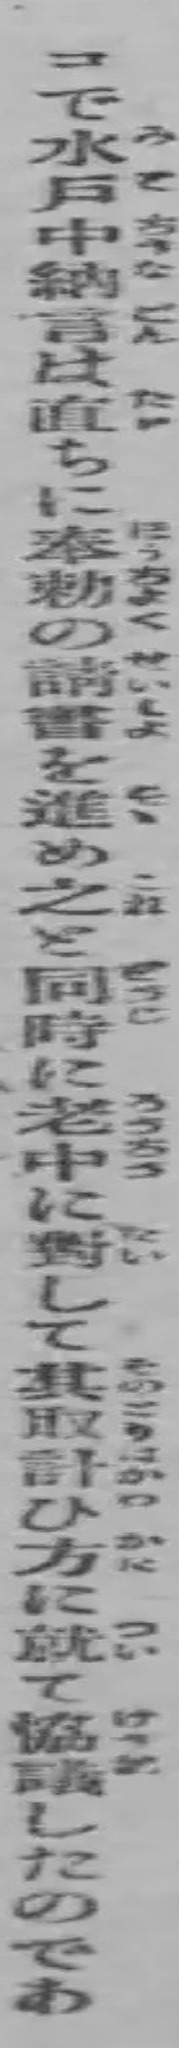コで水戸中納言は直ちに奉勅の請書を進め之と同時に老中に対して其取計ひ方に就て協議したのであ
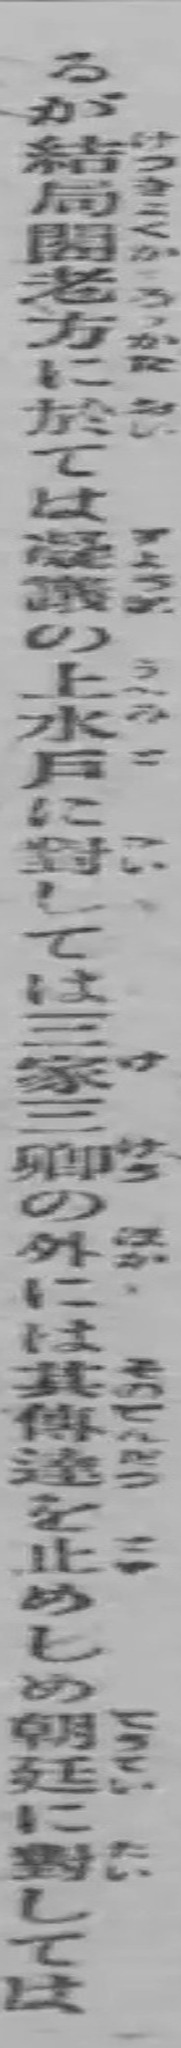るが結局閣老方に於ては凝議の上水戸に対しては三家三卿の外には其伝達を止めしめ朝廷に対しては
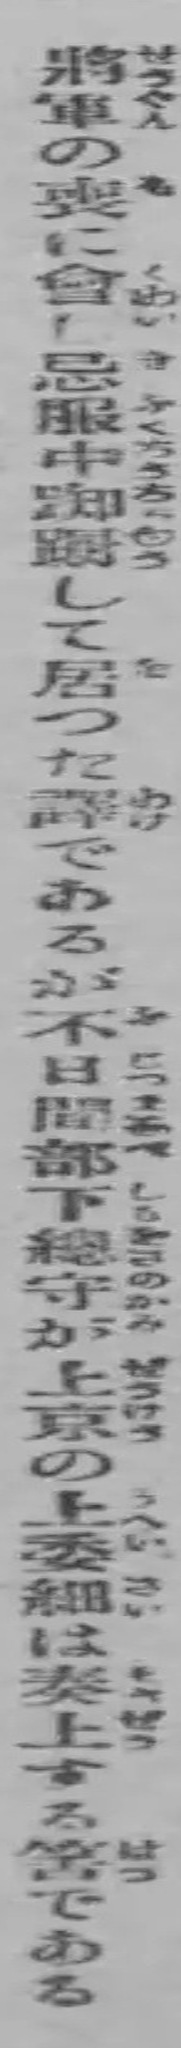将軍の喪に会し忌服中踟蹰して居つた訳であるが不日間部下総守が上京の上委細は奏上する筈である
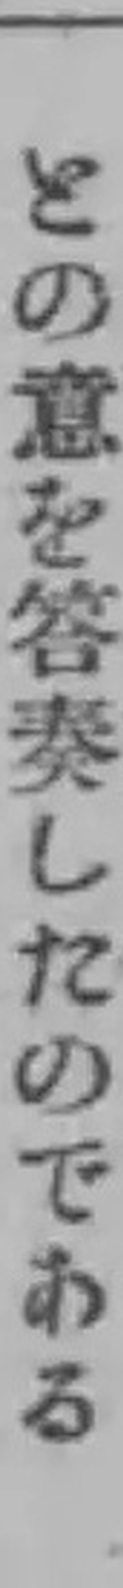との意を答奏したのである
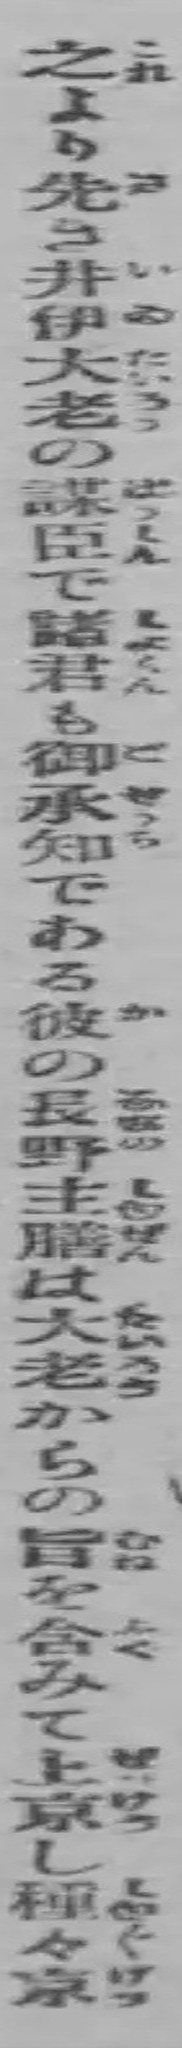之より先き井伊大老の謀臣で諸君も御承知である彼の長野主膳は大老からの旨を含みて上京し種々京
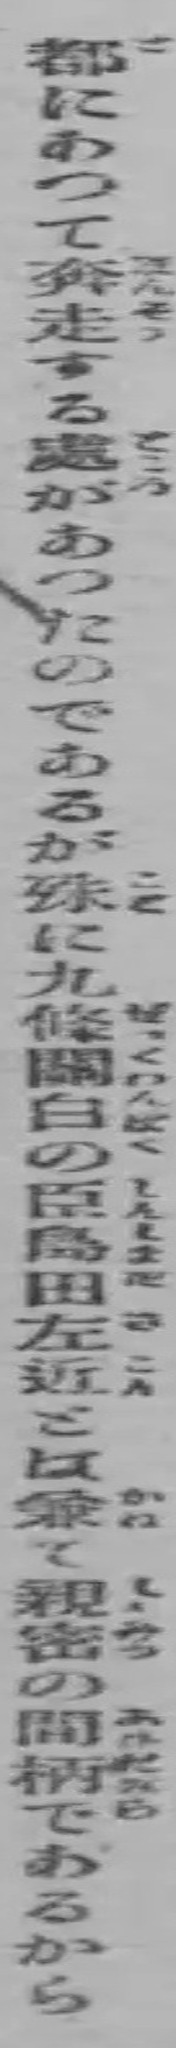都にあつて奔走する処があつたのであるが殊に九条関白の臣島田左近とは兼て親密の間柄であるから
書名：豊橋市史談
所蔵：国立国会図書館 National Diet Library, JAPAN
